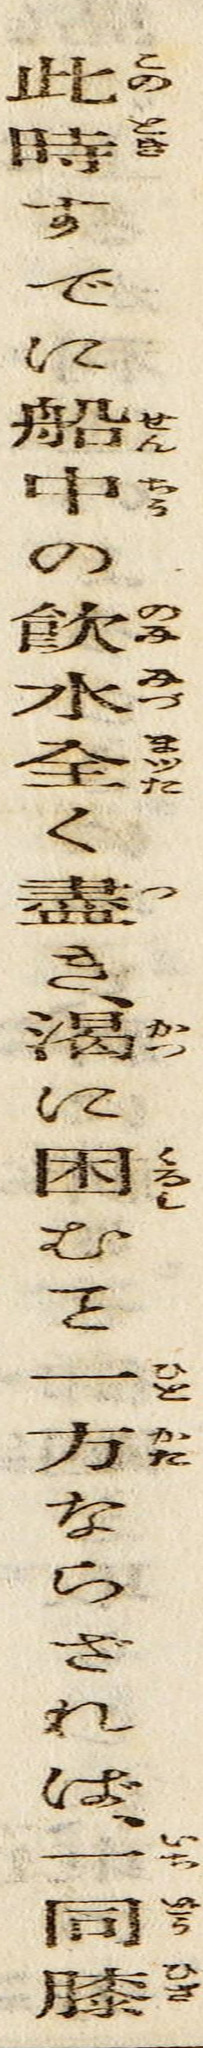此時すでに船中の飲水全く尽き、渇に困むこと一方ならざれば、一同膝
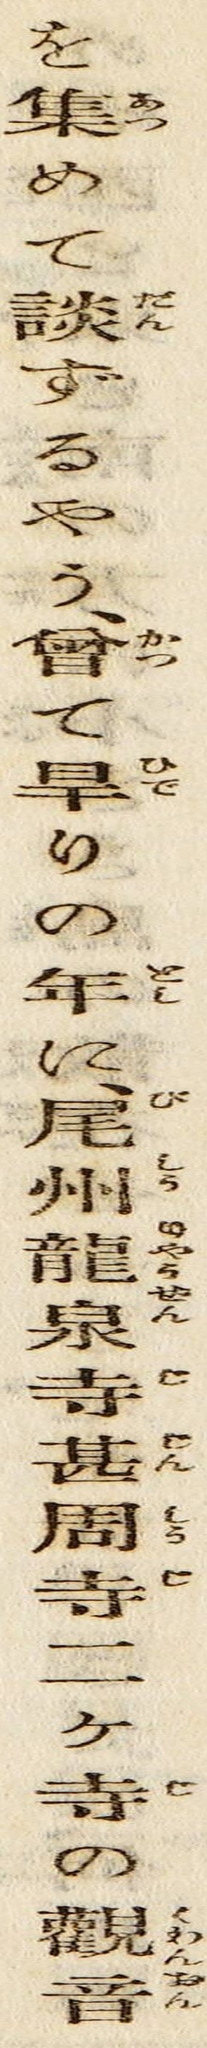を集めて談ずるやう、曽て旱りの年に、尾州竜泉寺甚周寺二ケ寺の観音
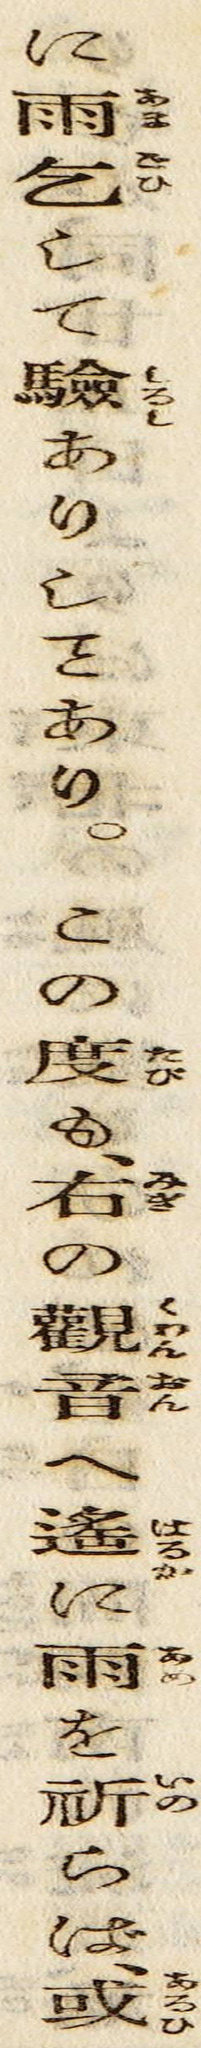に雨乞して験ありしことあり。この度も、右の観音へ遥に雨を祈らば、或
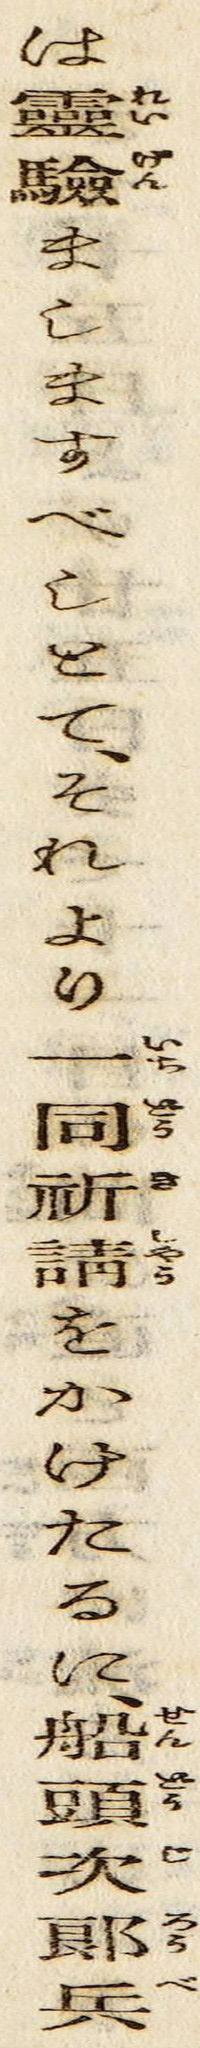は霊験ましますべしとて、それより一同祈請をかけたるに、船頭次郎兵
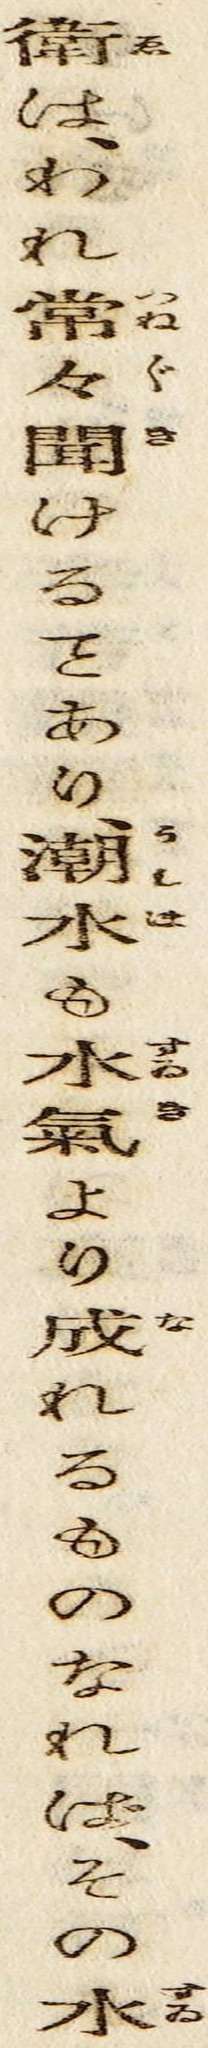衛は、われ常々聞けることあり、潮水も水気より成れるものなれば、その水
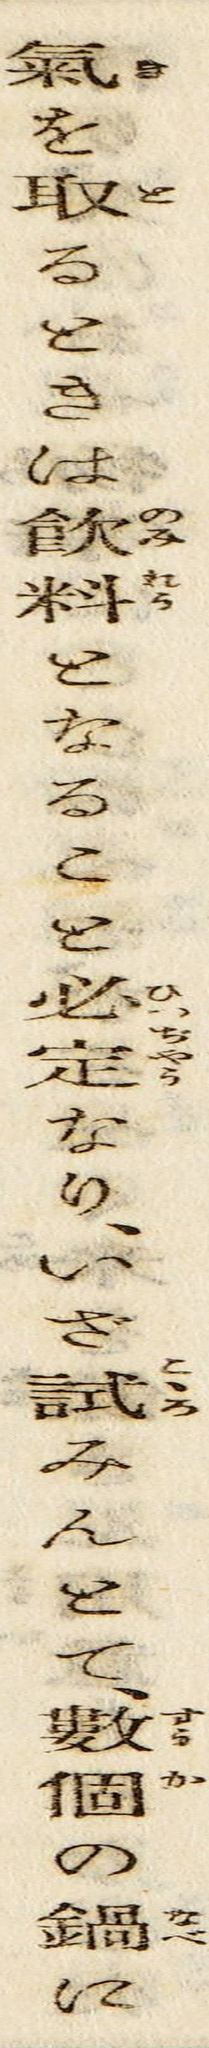気を取るときは飲料となること必定なり、いざ試みんとて、数個の鍋に
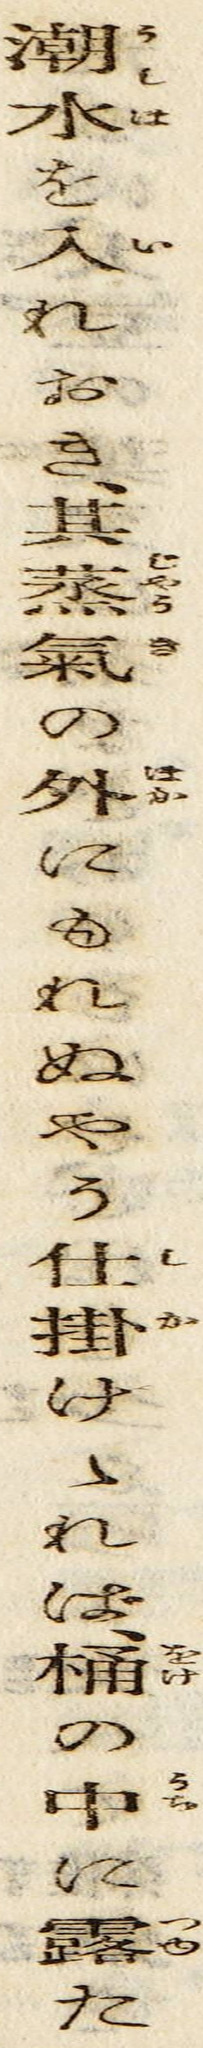潮水を入れおき、其蒸気の外にもれぬやう仕掛けゝれば、桶の中に露た
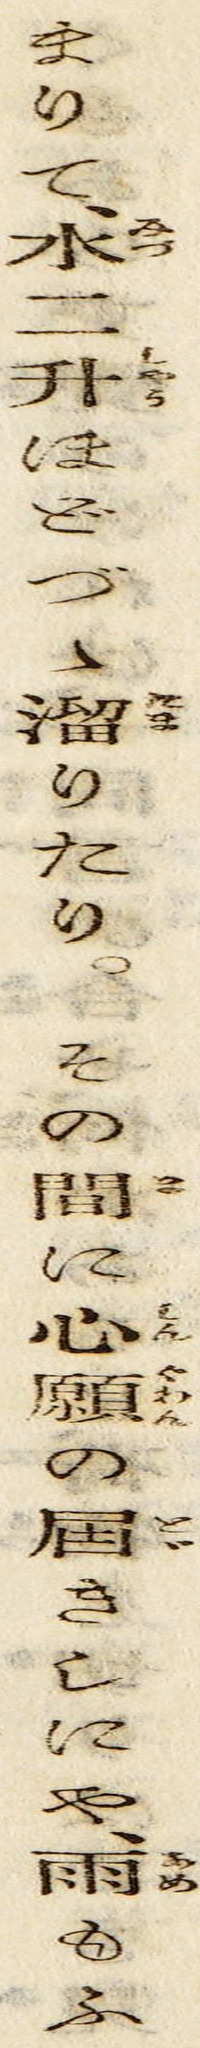まりて、水二升ほどづゝ溜りたり。その間に心願の届きしにや、雨もふ
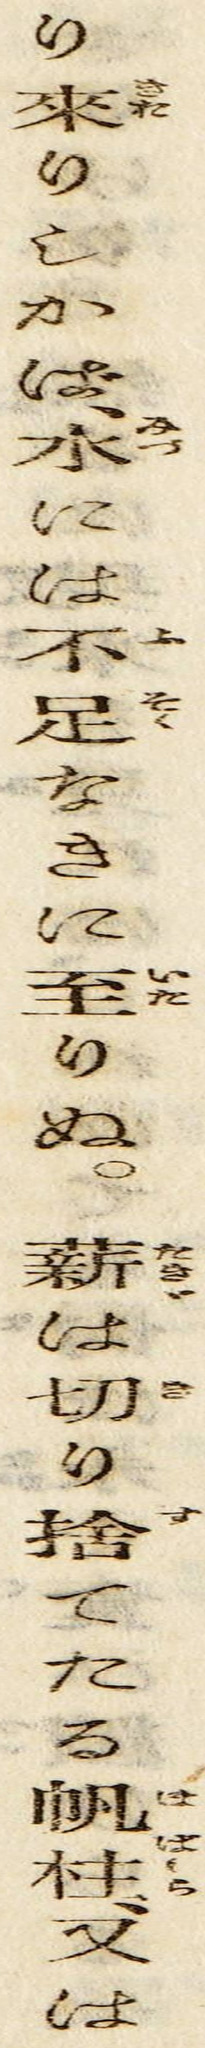り来りしかば、水には不足なきに至りぬ。薪は切り捨てたる帆柱、又は
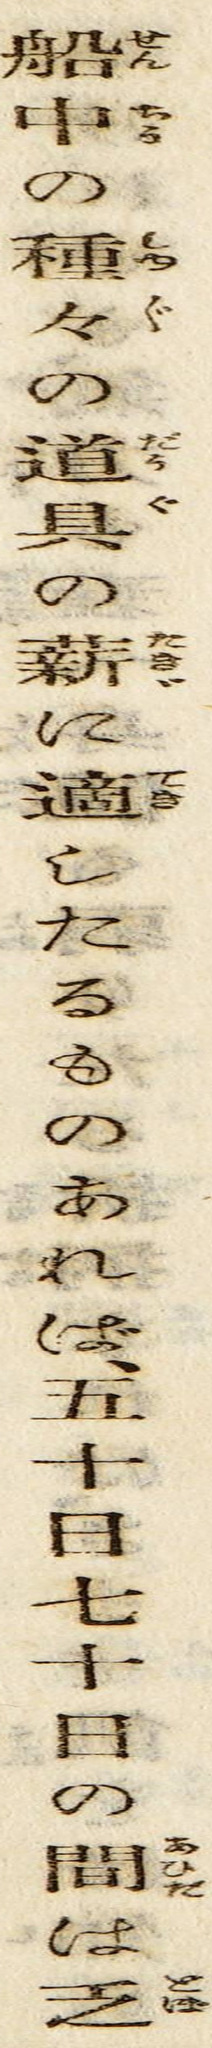船中の種々の道具の薪に適したるものあれば、五十日七十日の間は乏
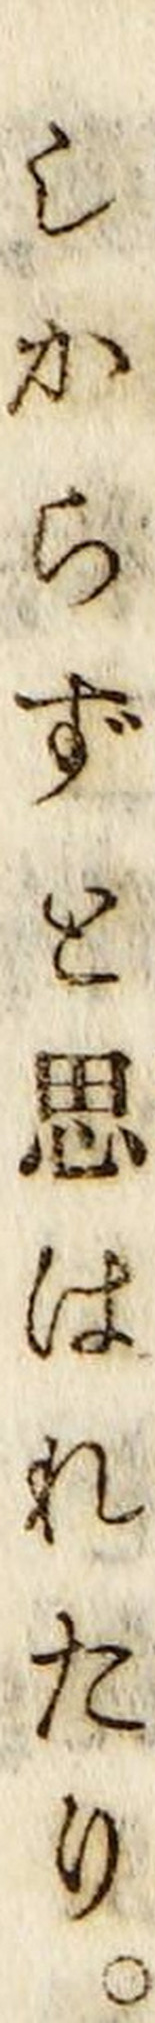しからずと思はれたり。
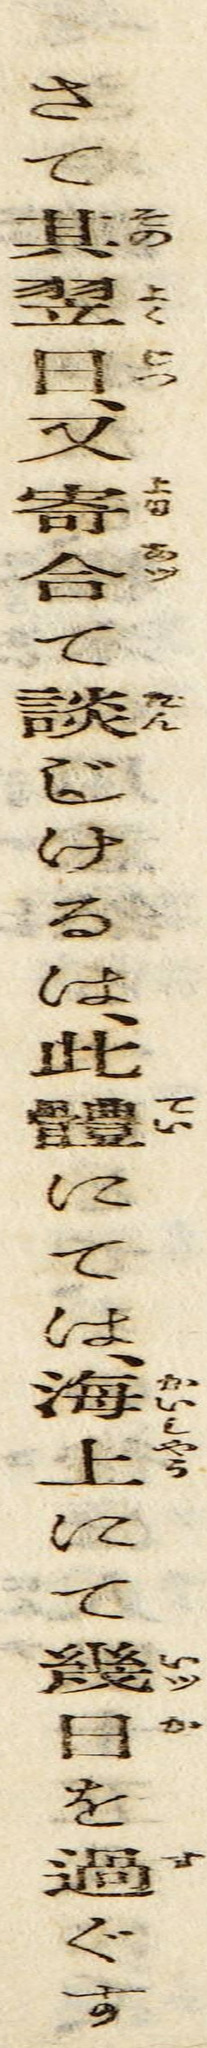さて其翌日、又寄合て談じけるは、此体にては、海上にて幾日を過ぐす

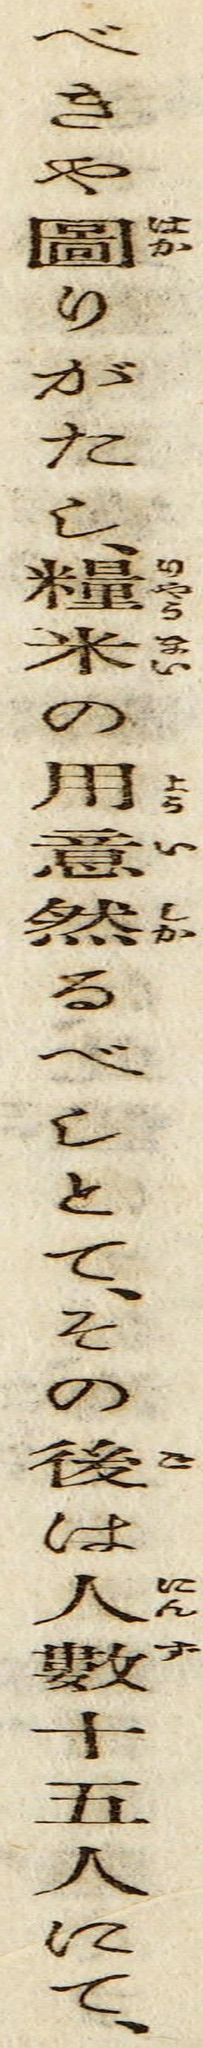べきや図りがたし、糧米の用意然るべしとて、その後は人数十五人にて、
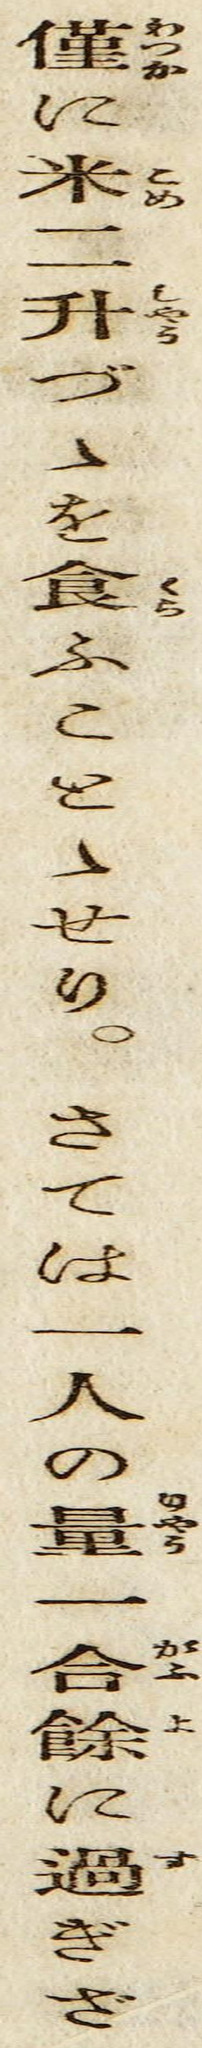僅に米二升づゝを食ふことゝせり。さては一人の量一合余に過ぎざ
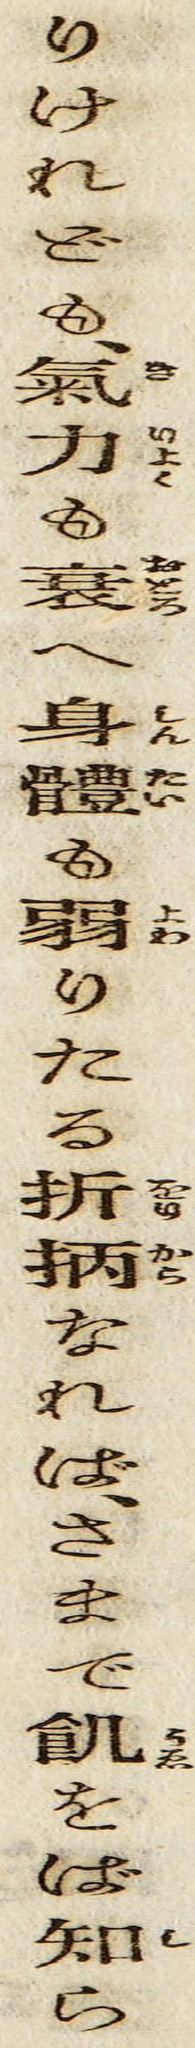りけれども、気力も衰へ身体も弱りたる折柄なれば、さまで飢をば知ら
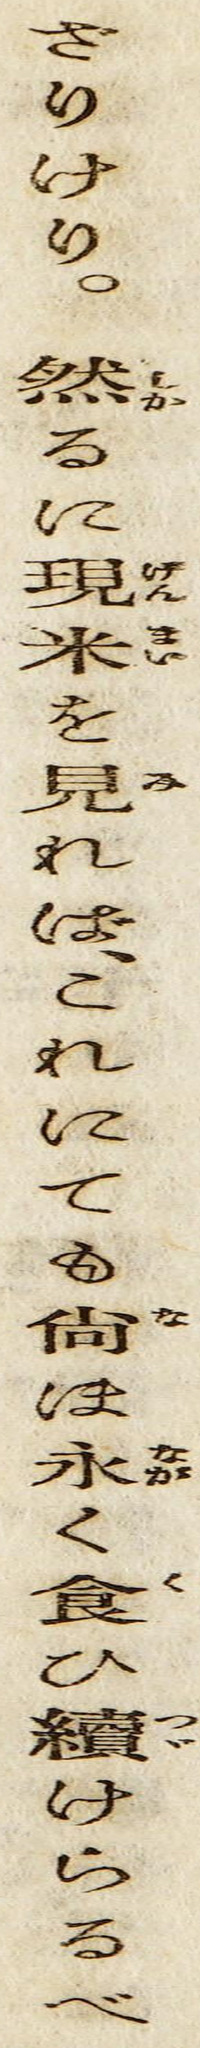ざりけり。然るに現米を見れば、これにても尚ほ永く食ひ続けらるべ
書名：日本漂流譚
